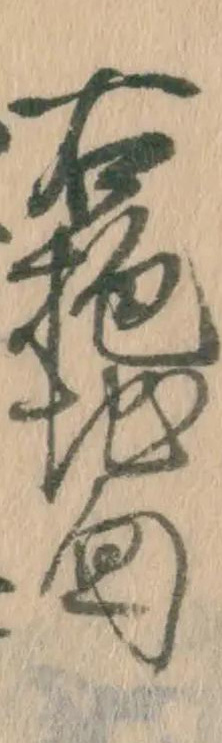右抱地面

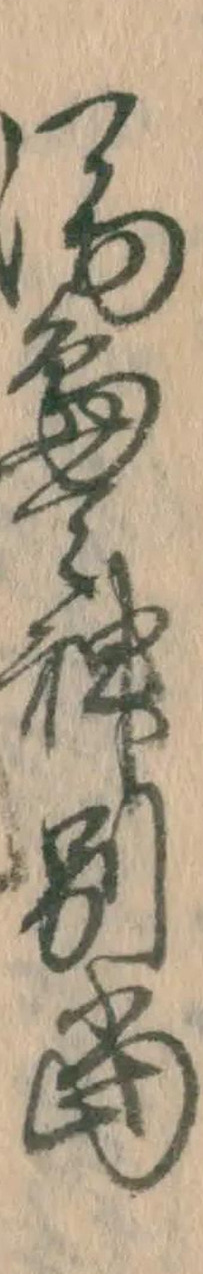湯島天神別当
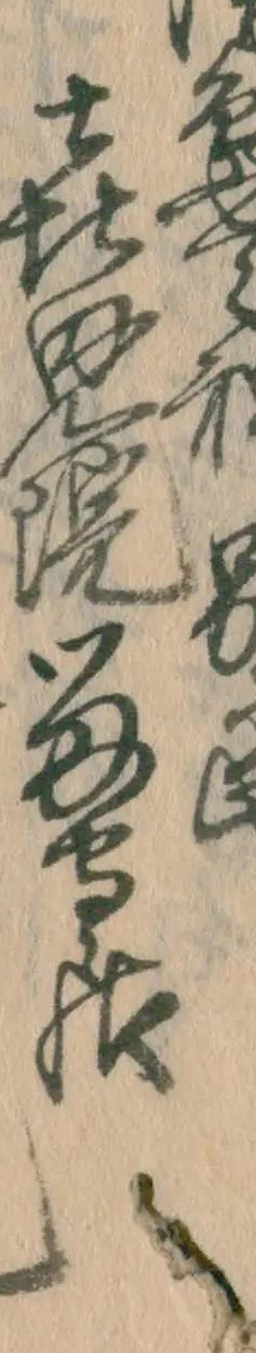喜見院留守居
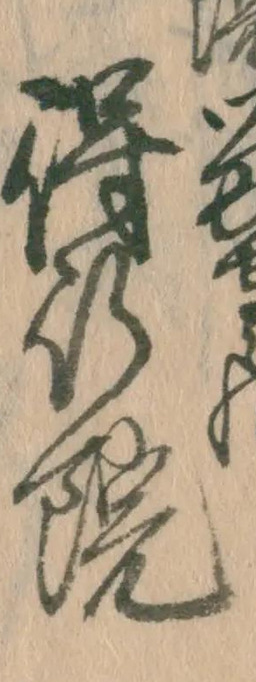得行院
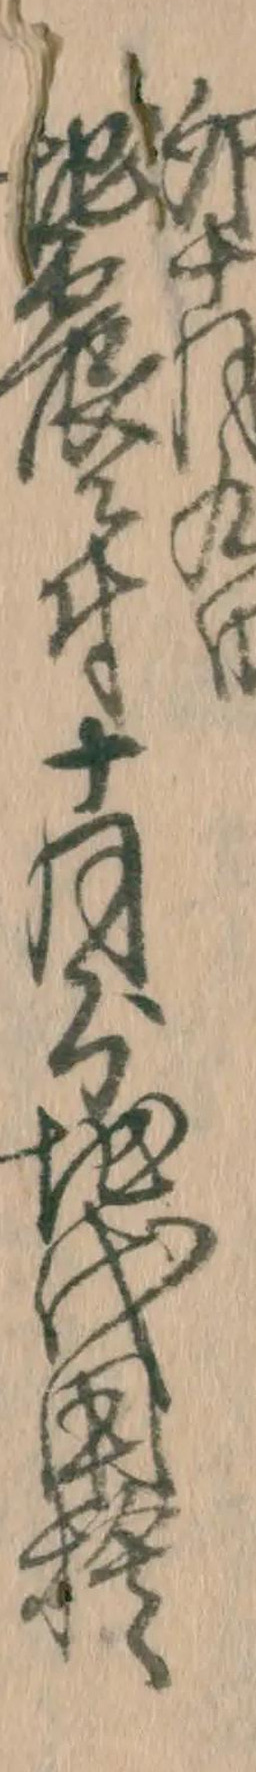地震ニ付十月分地代用捨地借
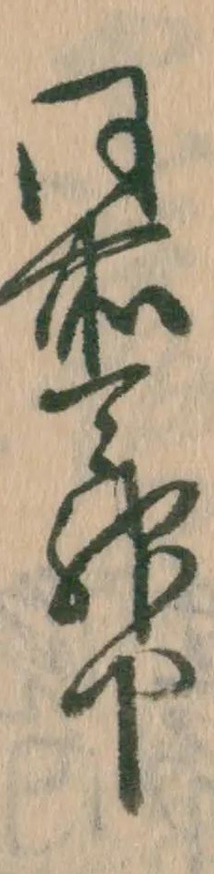同所天神下
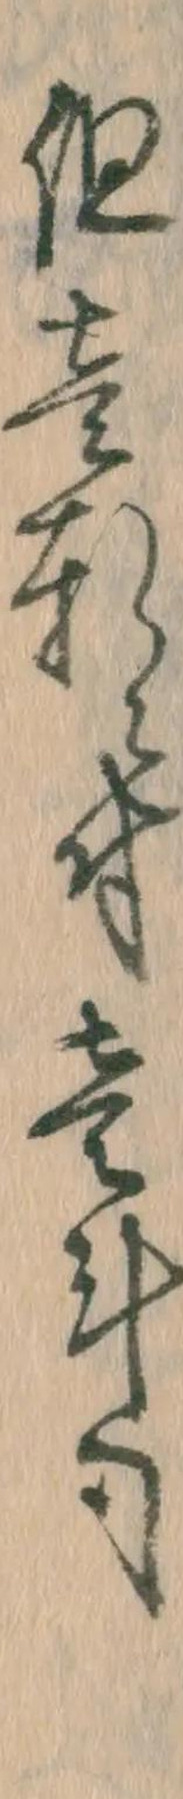但壱軒ニ付壱斗ツヽ
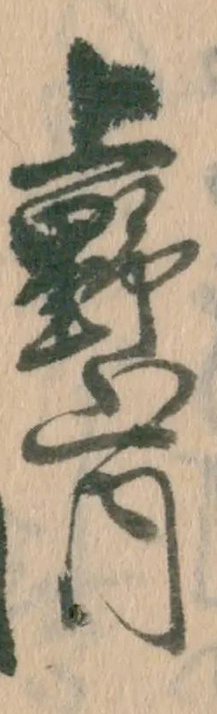上野山内
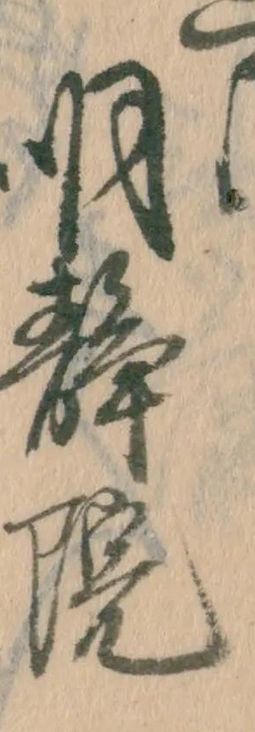明静院
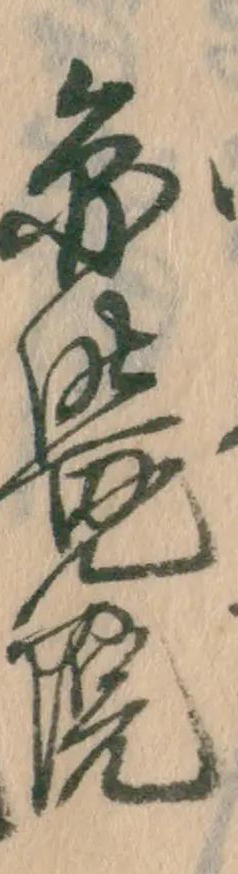円覚院

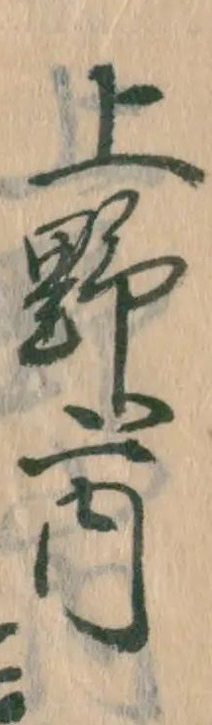上野山内
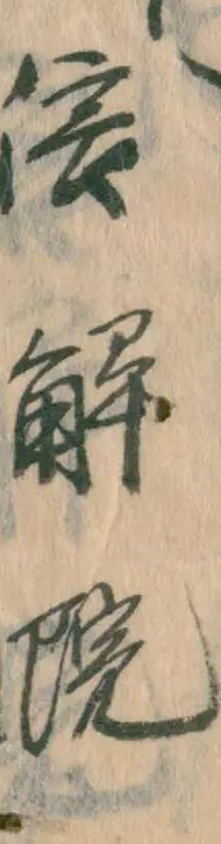信解院
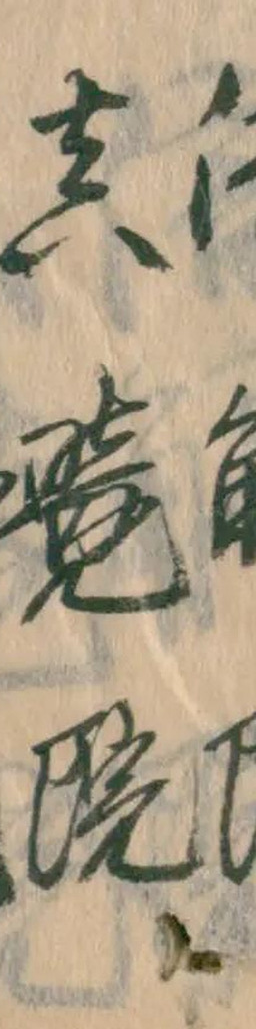真覚院
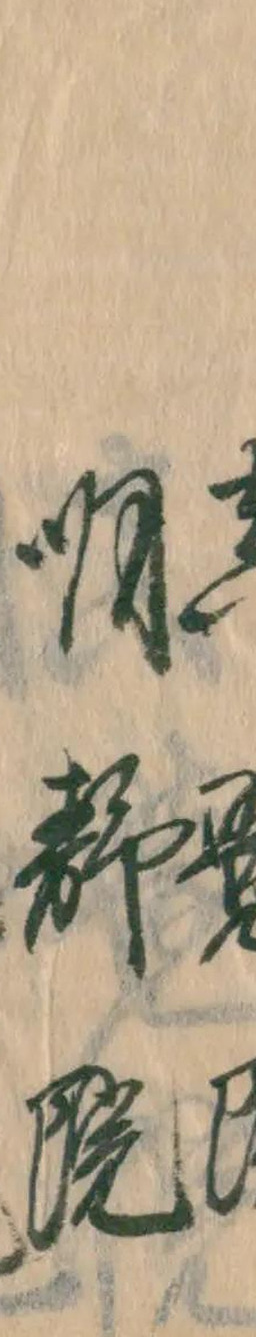明静院
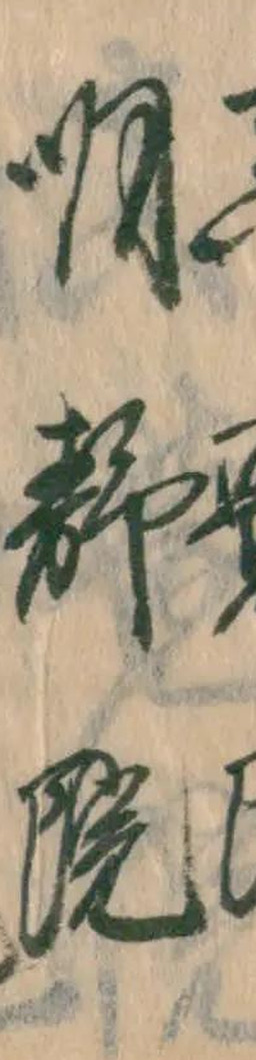明静院
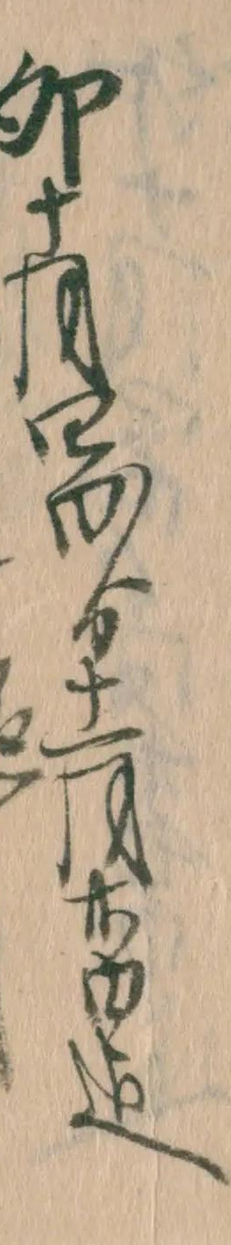卯十月四日ゟ十一月廿日迄種総院
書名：武家方并寺院等ニテ施差出候一件
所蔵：国立国会図書館 National Diet Library, JAPAN
